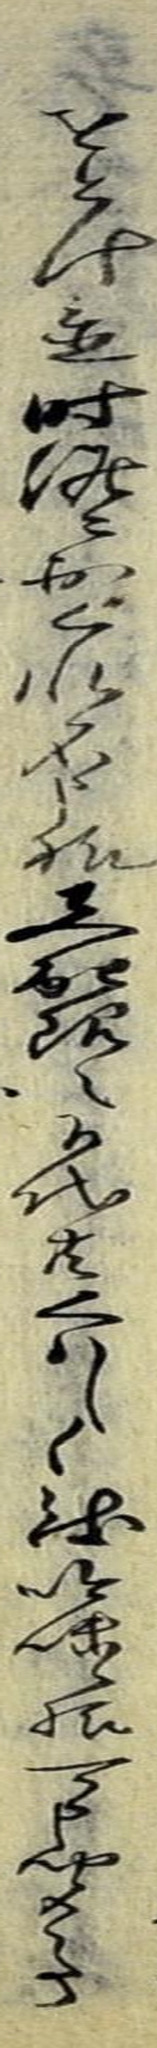をとけ置時候におくれ不申様支配限之下代共くはしく致吟味候様可申聞事
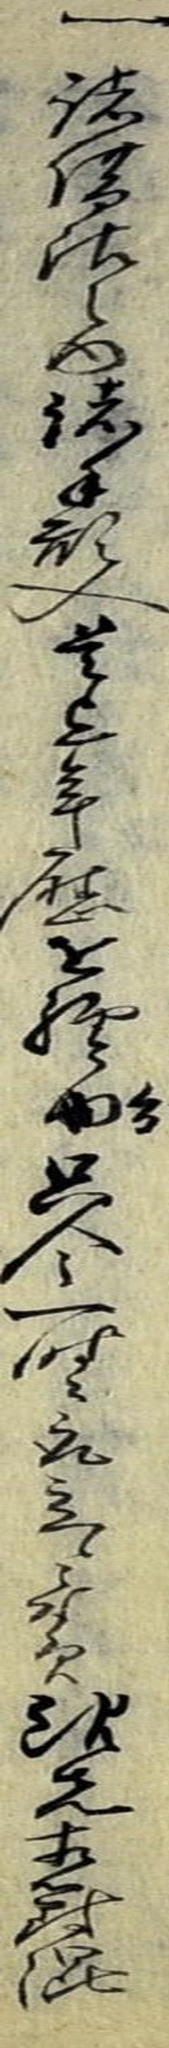一諸借銀之内諸手形入是迄年歴を経候内分只今一時に取立候に付而は銀先相対混
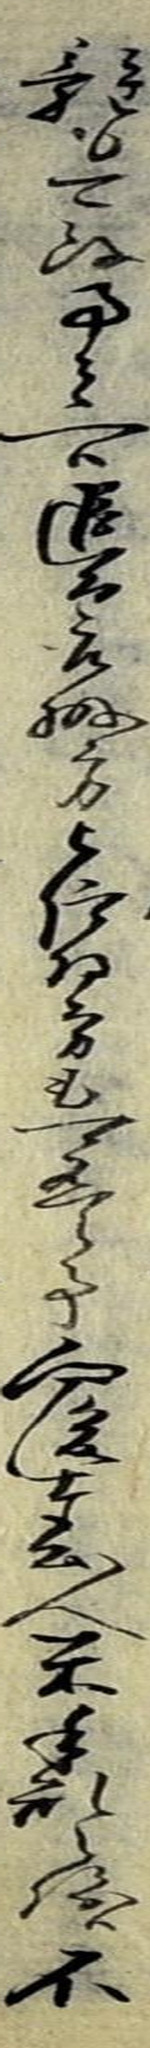雑も可致事に候へは追而取扱方被仰付方も可有之事向後奉公人米手形之儀は不
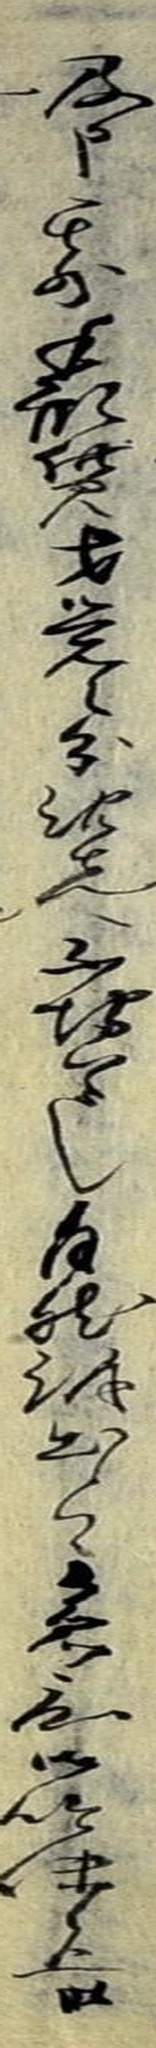及申其外手形質才覚之分銀先へ不埒いたし自然訴出候はゝ急度御吟味之上御
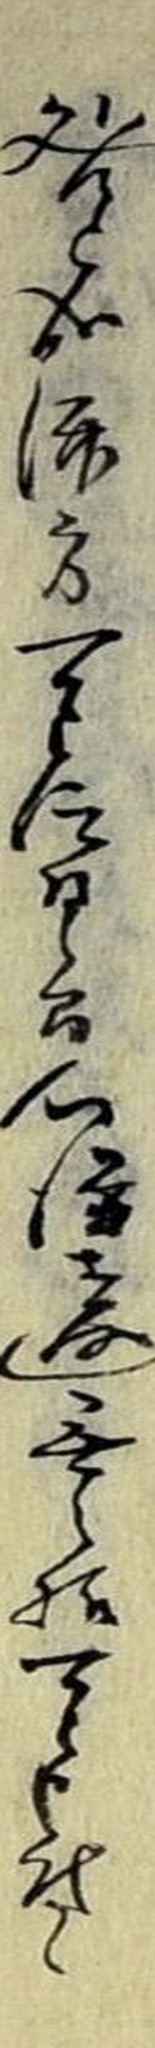咎被成済方可被仰付候間心得無之様可被申付候
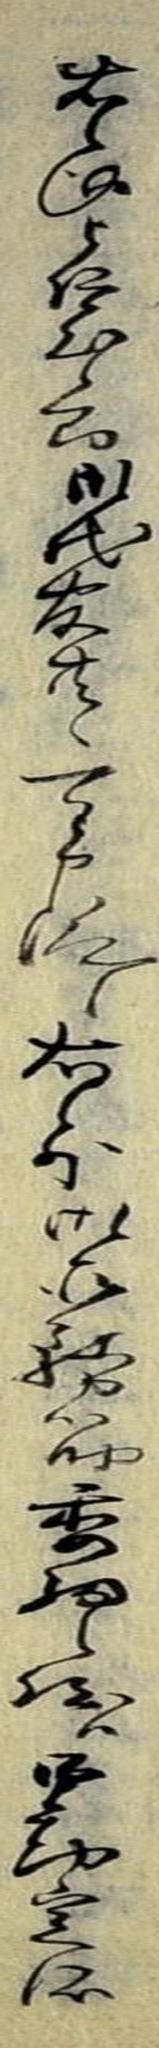右之趣被仰出候間御代官共へ可被申渡候右之外御所務筋委細之儀は御勘定所
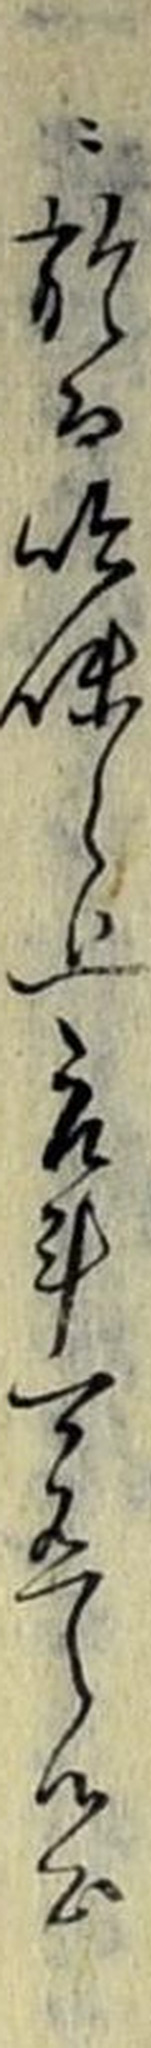に於而吟味之上取斗可有之候以上
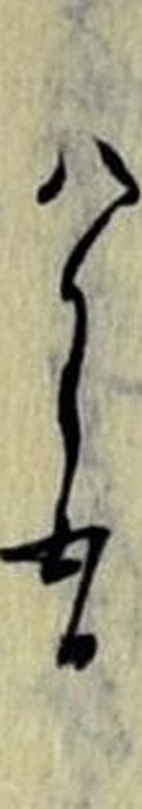八月五日
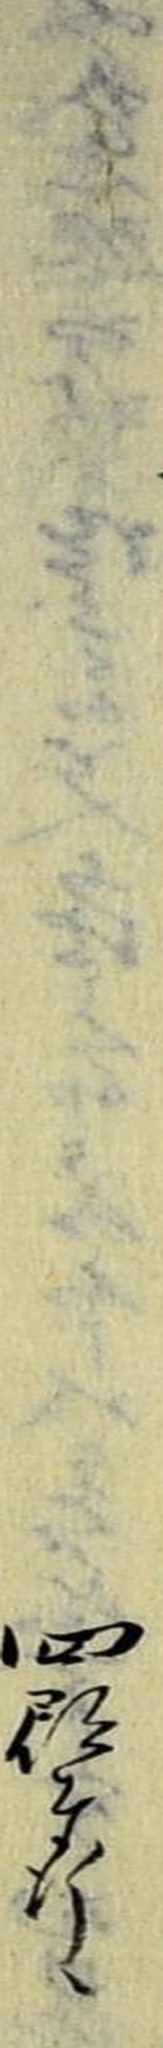四郡奉行へ
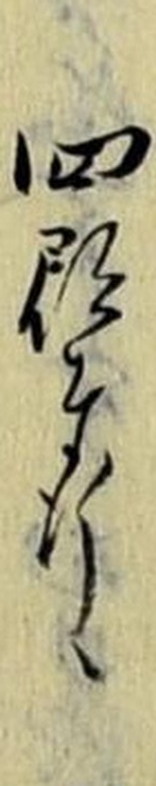四郡奉行へ
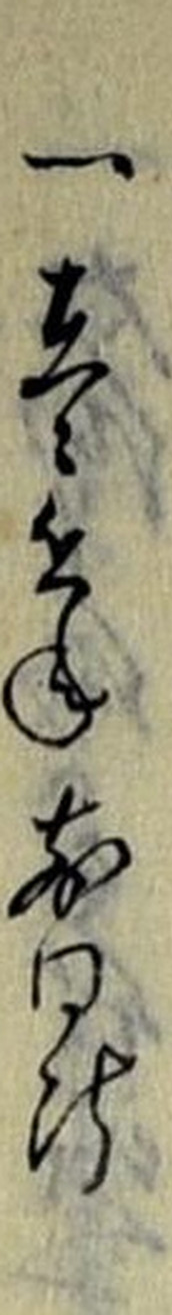一在々近年前同断
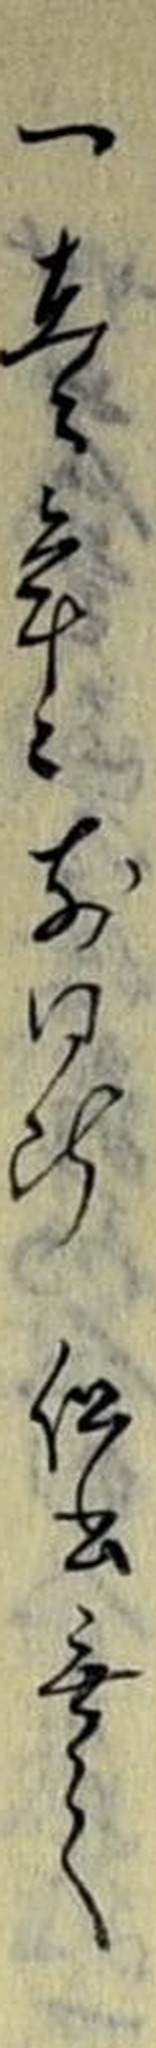一在々年々前同断但書無之
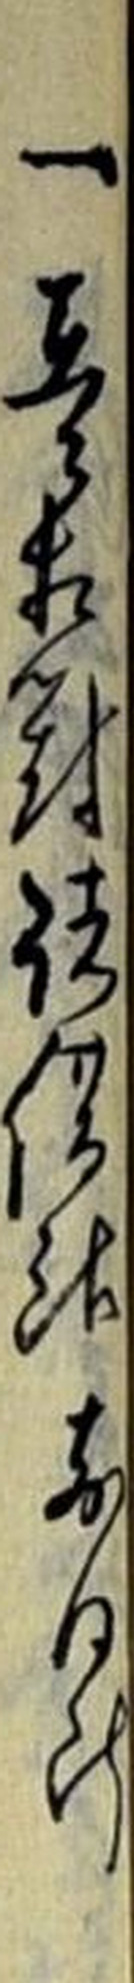一在々相対諸借銀前同断
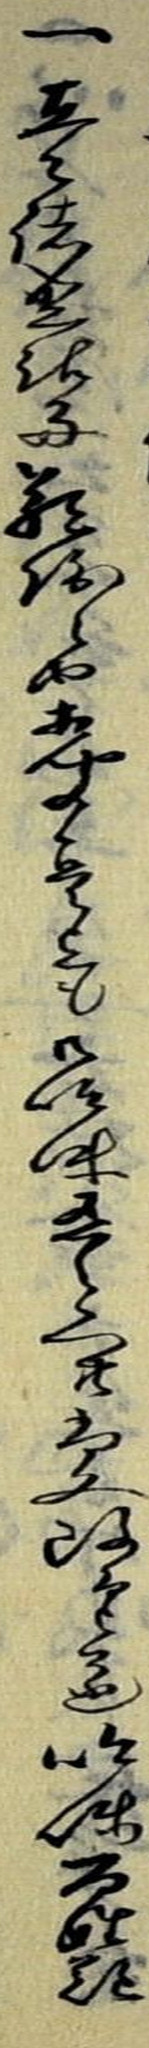一在々諸盛銀多難儀之由相聞候是迄も御吟味有之候へ共尚又改而被遂吟味百姓難
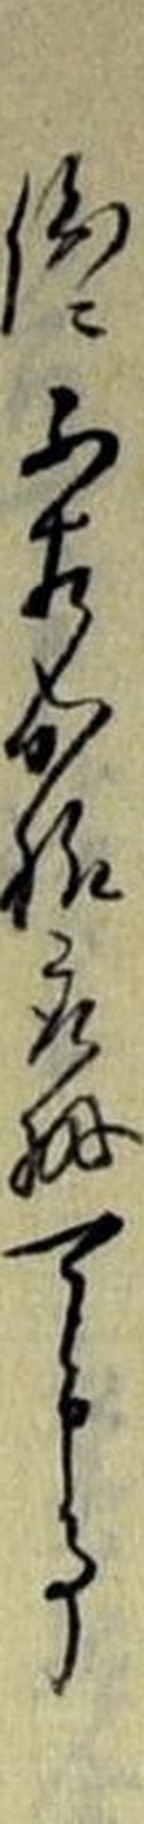儀に不相成様取扱可被申事
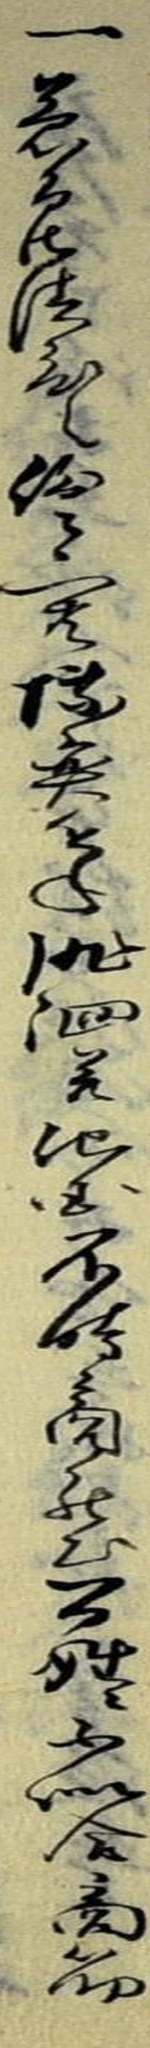一兼而御法度之儀に候へ共博奕近年徘徊并他国不時商罷出百姓に不似合商筋
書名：命令之部 二
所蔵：福井県文書館 Fukui Prefectural Archives
